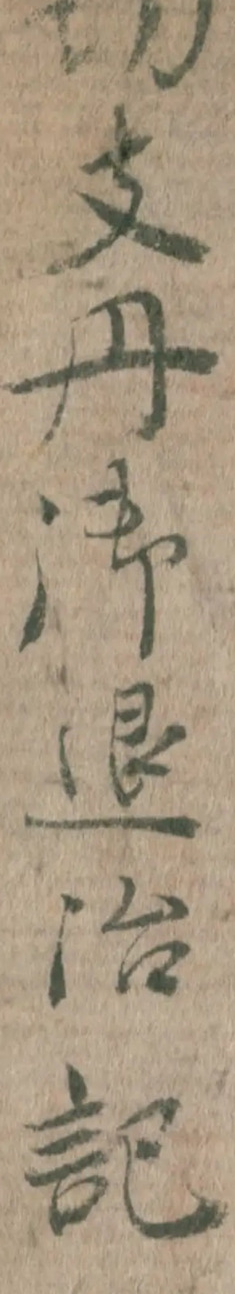切支丹御退治記三
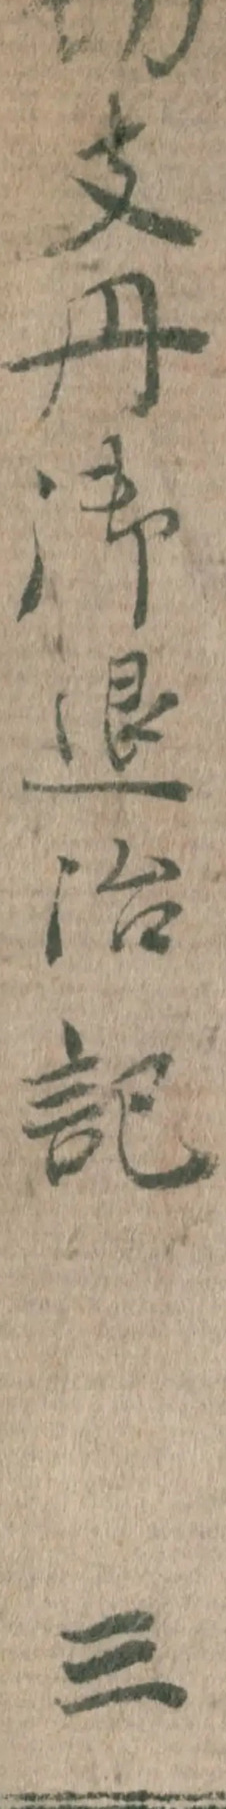切支丹御退治記三

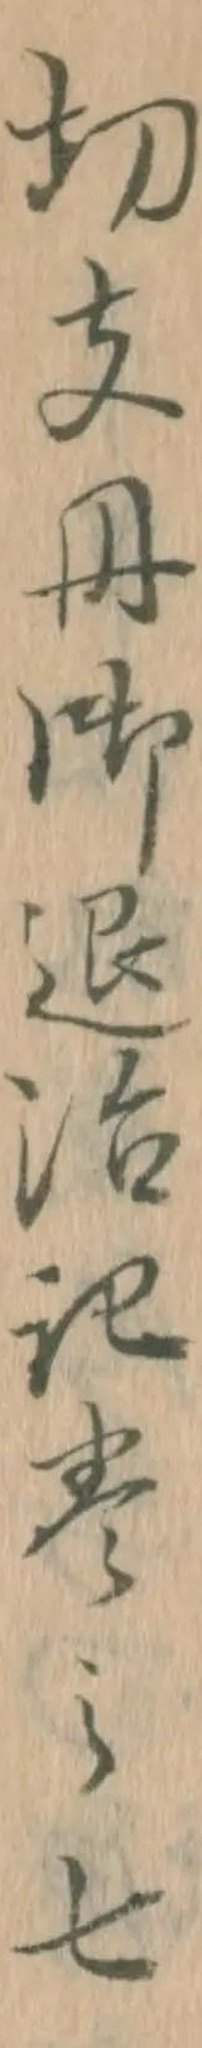切支丹御退治記巻之七
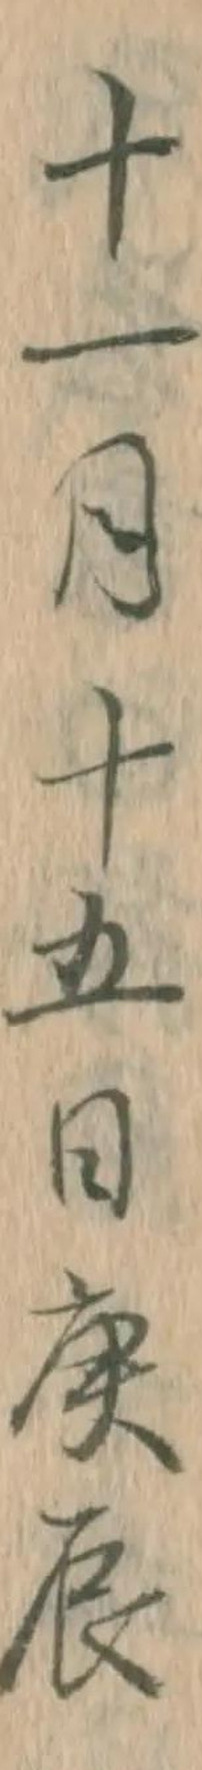十一月十五日庚辰
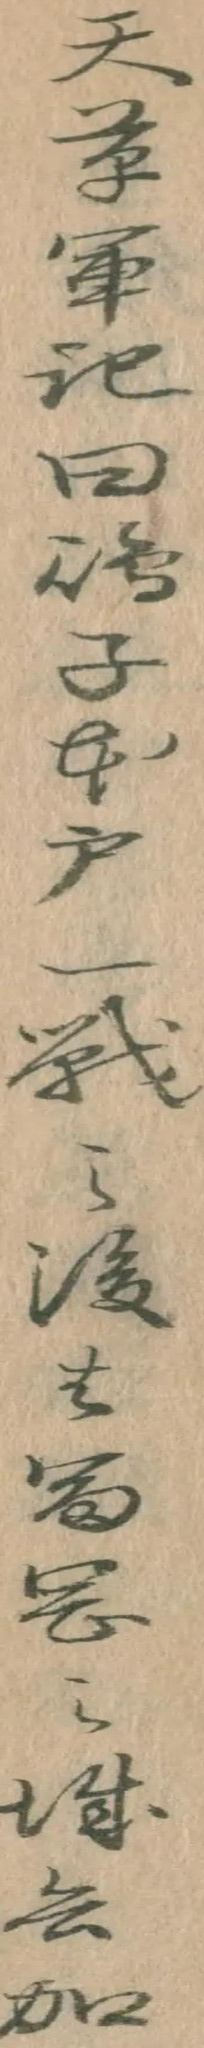天草軍記曰島子本戸一戦之後は富岡之城兵加
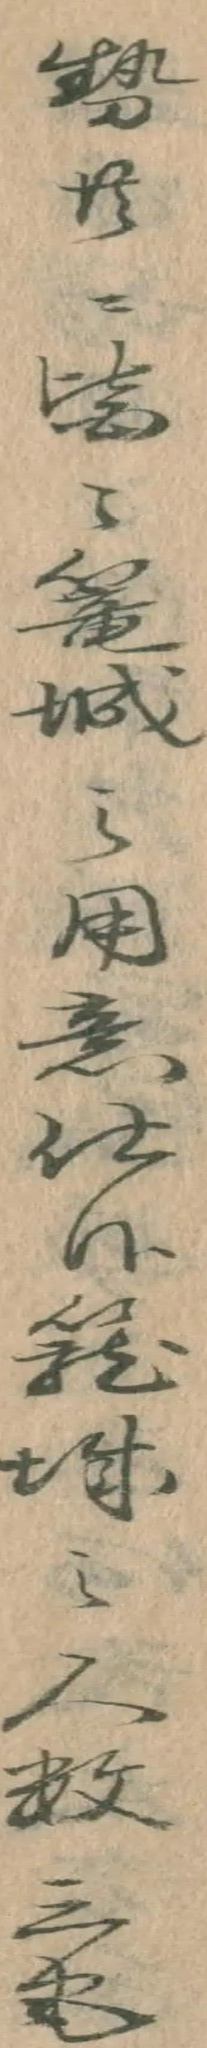勢共に皆々籠城之用意仕候籠城之人数三宅
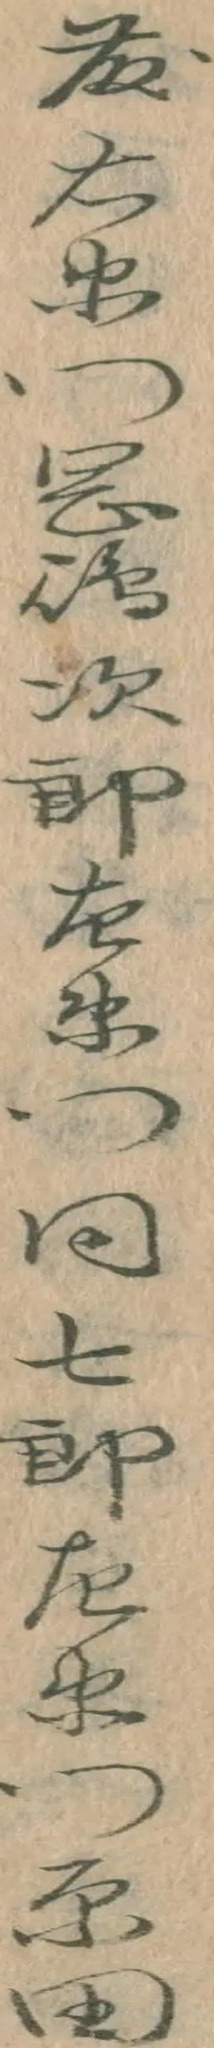藤右衛門岡島次郎左衛門同七郎左衛門原田
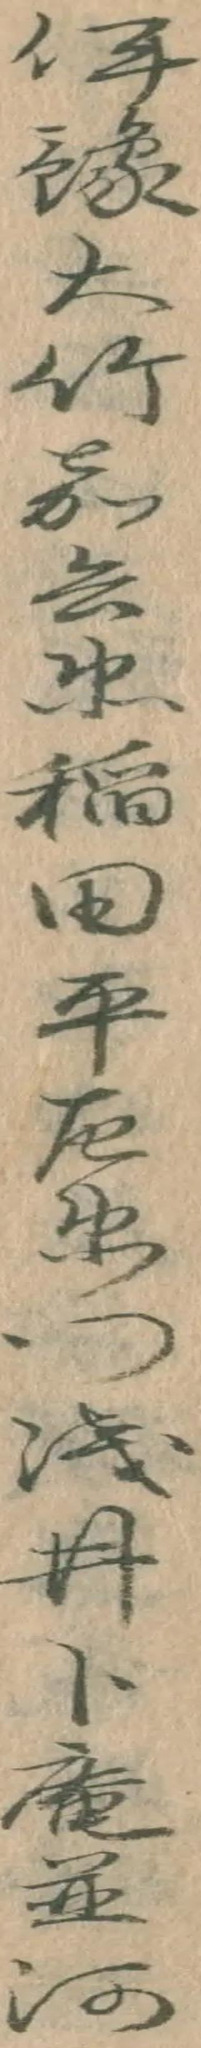伊予大竹嘉兵衛稲田平左衛門浅井卜庵並河
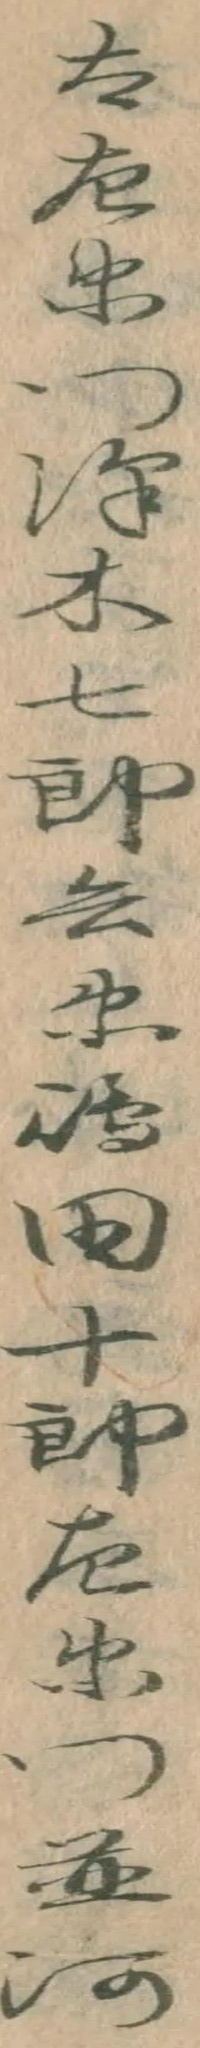太左衛門沢木七郎兵衛島田十郎左衛門並河
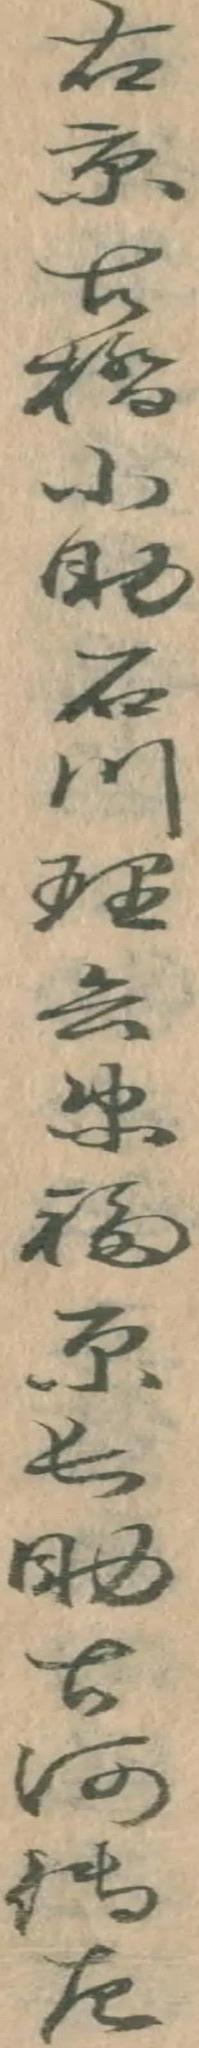右京古橋小助石川理兵衛福原長助古河伝左
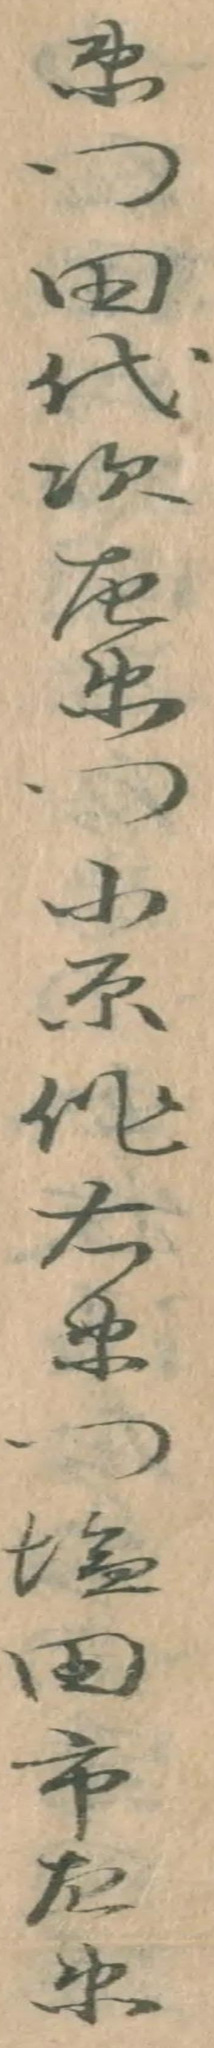衛門田代次左衛門小原作右衛門塩田市左衛

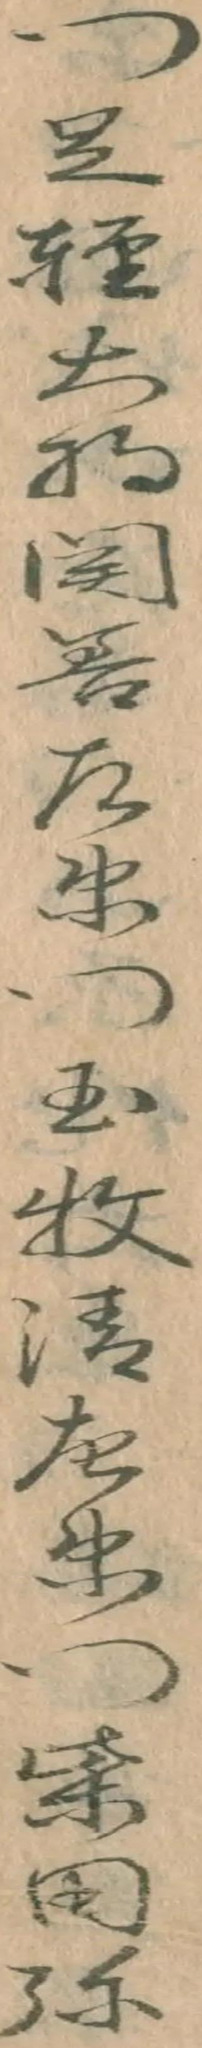門足軽大将関善左衛門玉牧清左衛門柴田弥
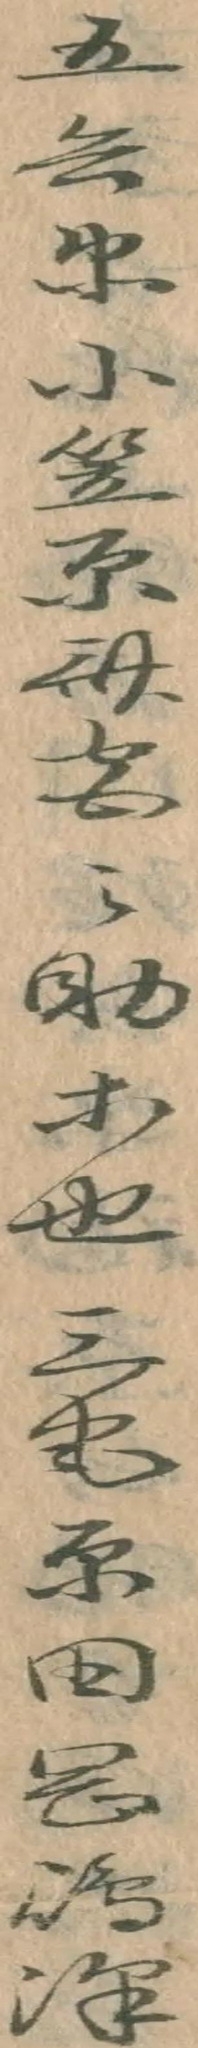五兵衛小笠原斎宮之助等也三宅原田岡島沢
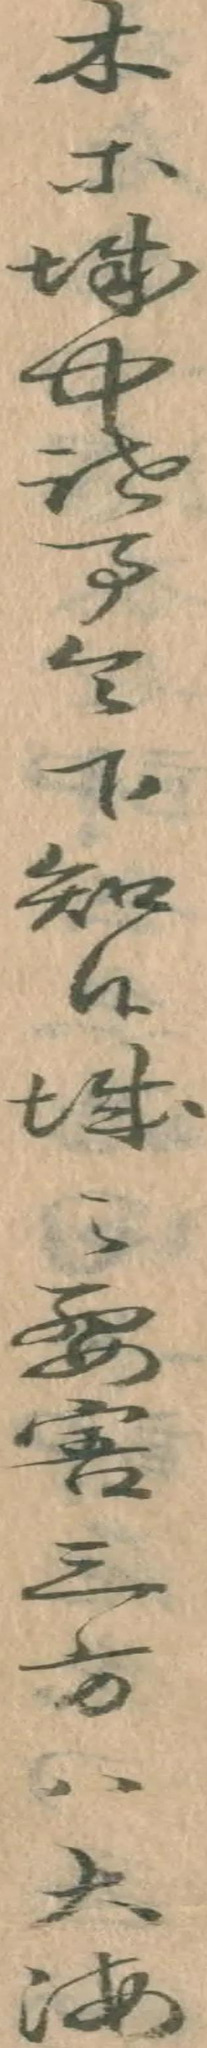木等城中諸事令下知候城之要害三方は大海
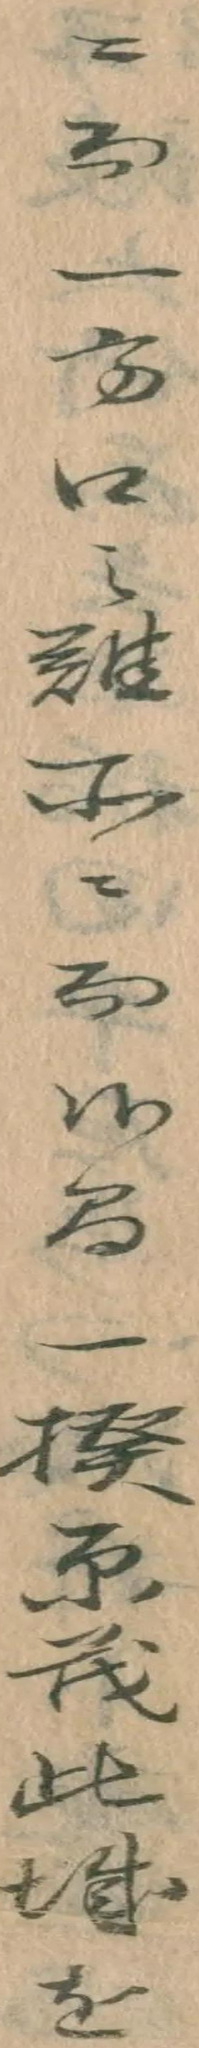に而一方口之難所に而候間一揆原も此城を
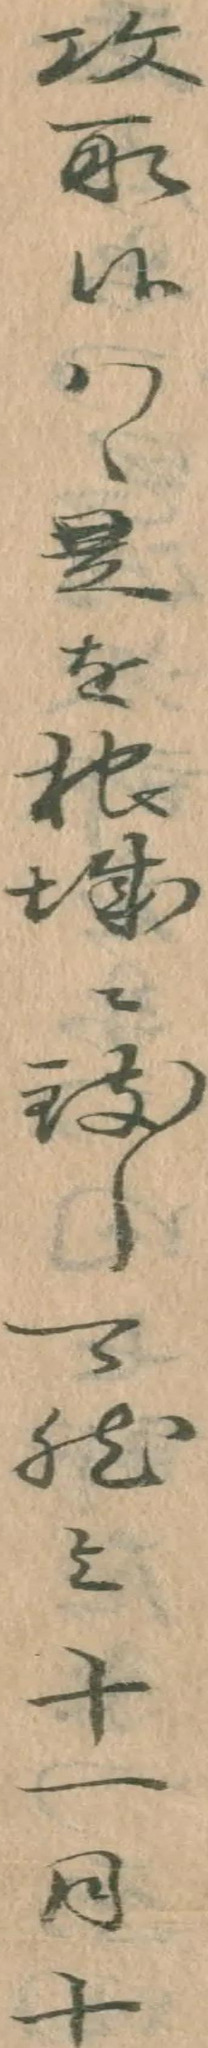攻取候はゝ是を根城に致し可然と十一月十
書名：切支丹御退治記 49巻. [3]
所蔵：国立国会図書館 National Diet Library, JAPAN
